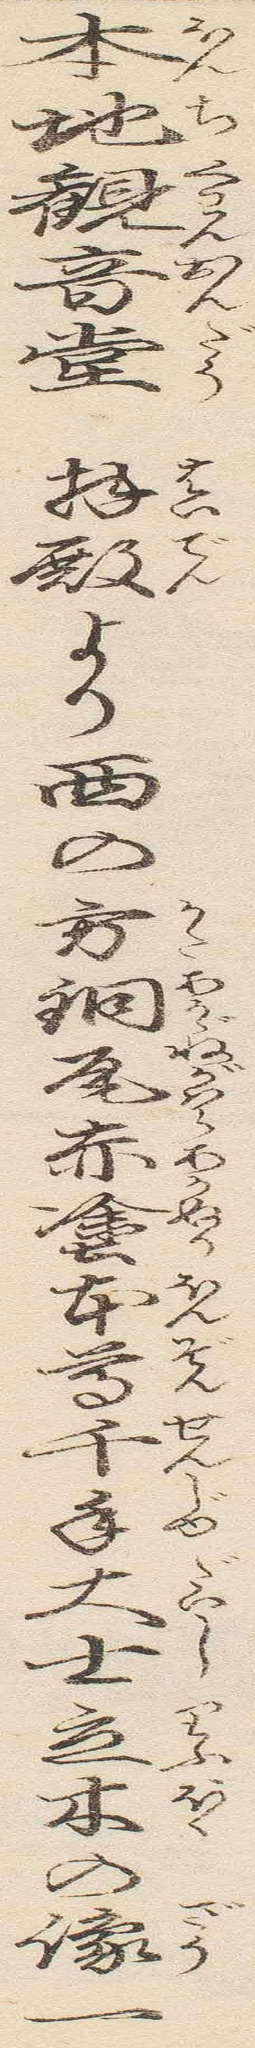本地観音堂拝殿より西の方銅瓦赤塗本尊千手大士立木の像一
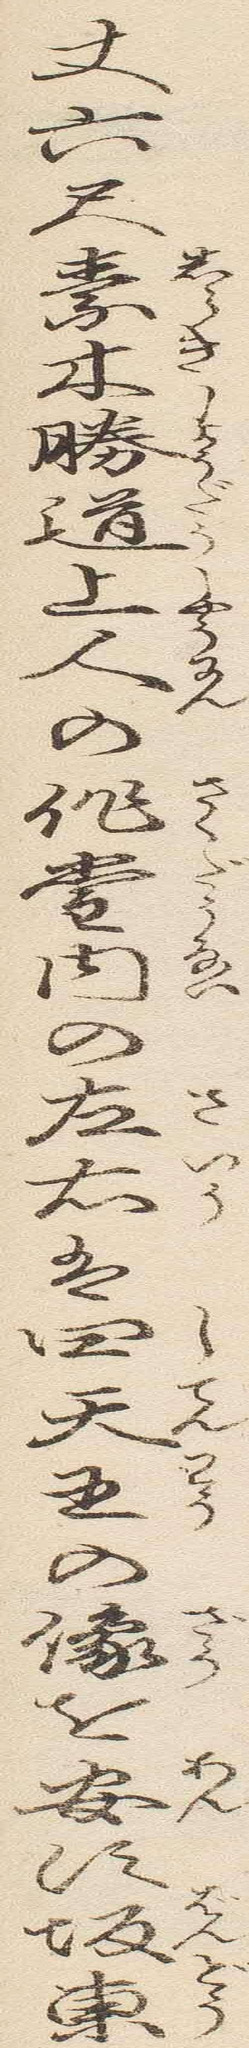丈六尺素木勝道上人の作堂内の左右は四天王の像を安す坂東
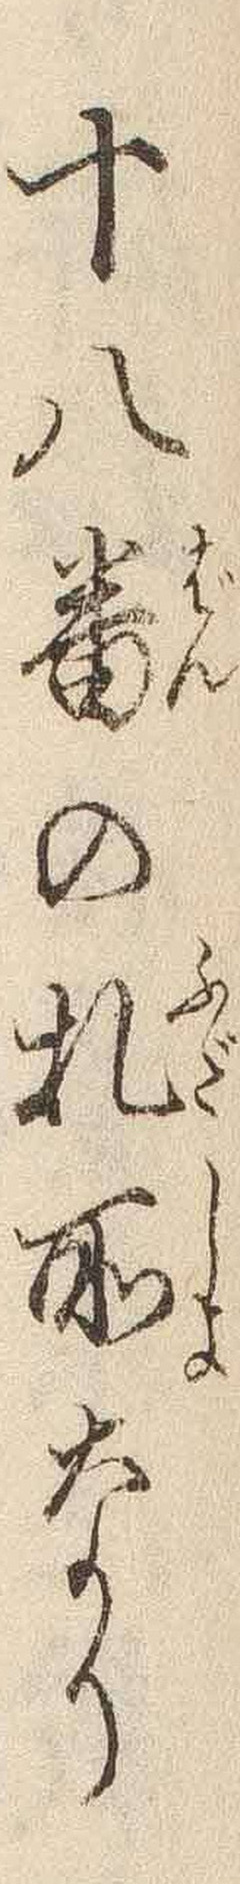十八番の札所なり
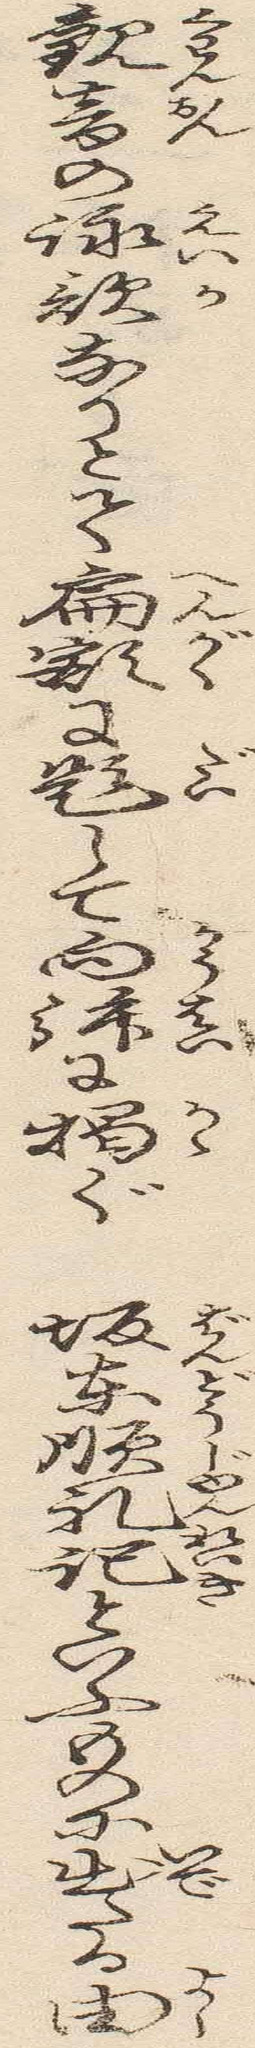觀音の詠歌なりとて扁額に題して向拜に掲ぐ坂東順礼記といふものに出たる由
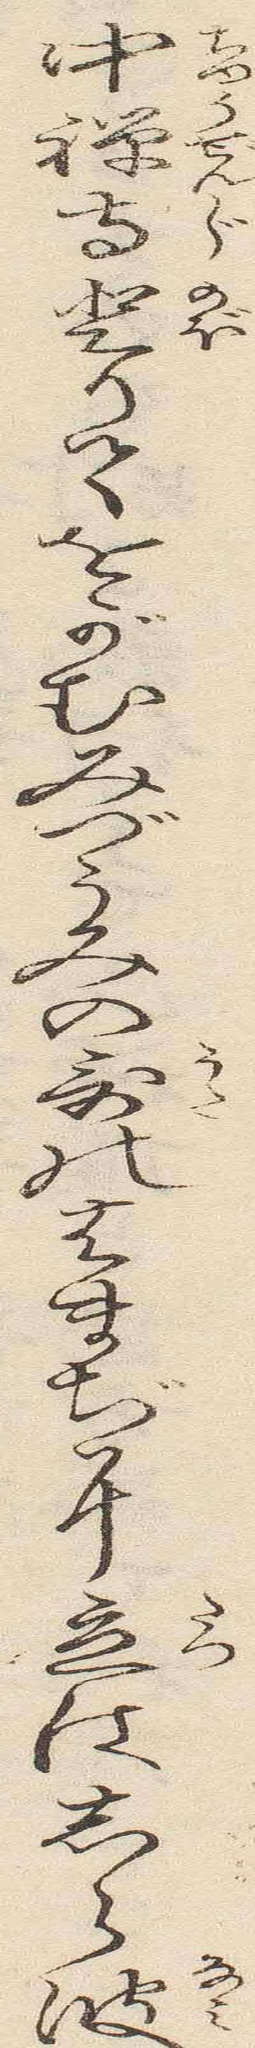中禅寺登りてをがむみづうみの哥のはまぢに立はしら波
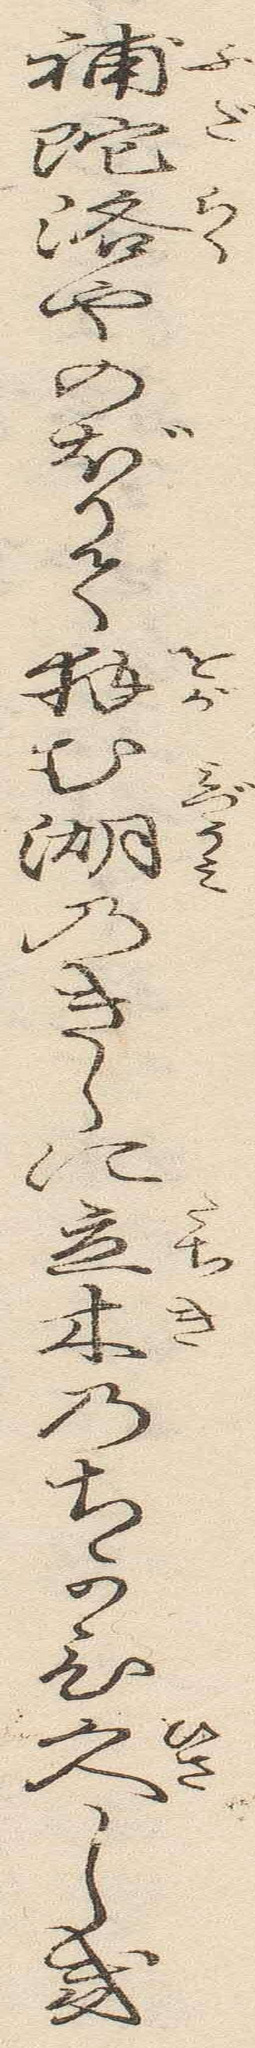補陀洛やのぼりて拝む湖のきしに立木のちかひ久しき
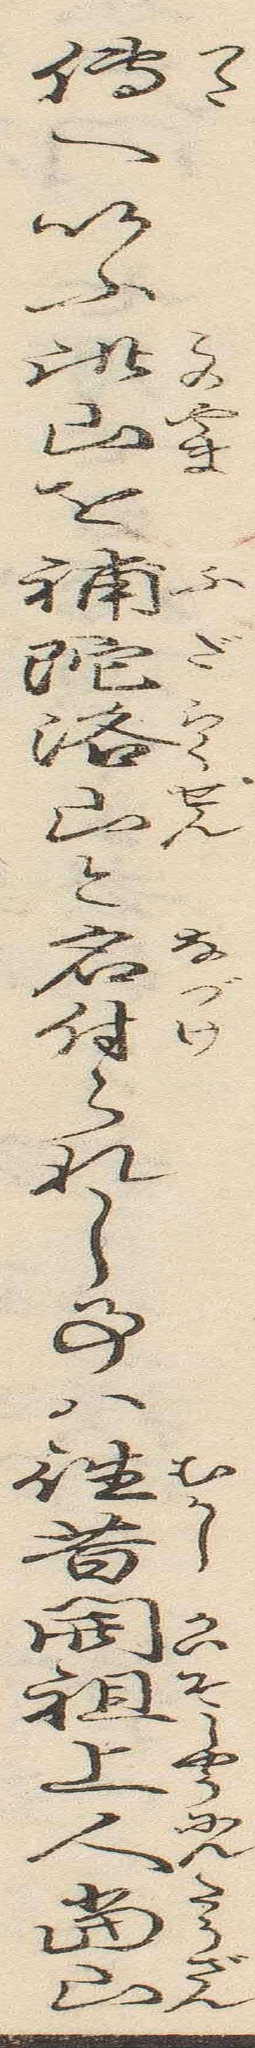傳へいふ此山を補陀洛山と名附られし事は徃昔開祖上人當山
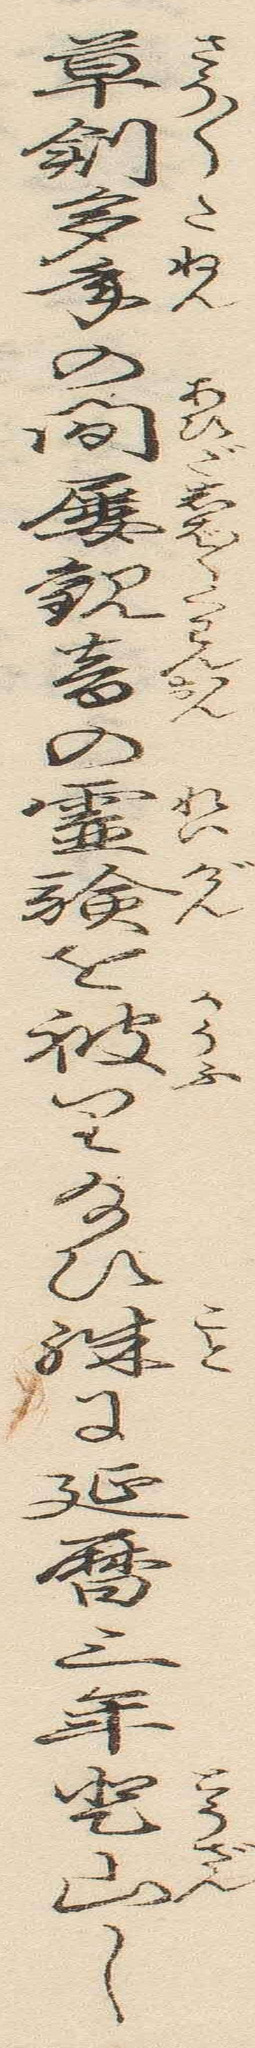草創多年の間屡觀音の霊験を被り給ひ殊に延暦三年登山し
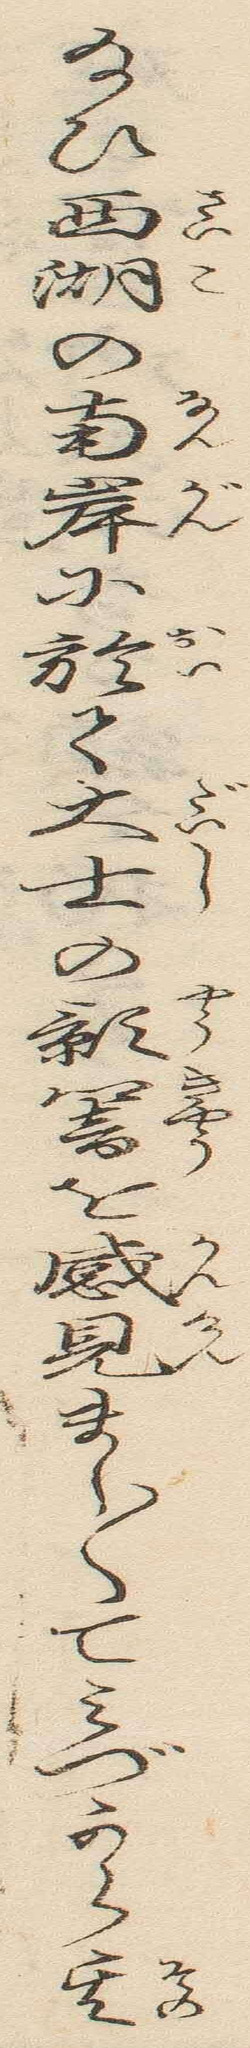給ひ西湖の南岸に於て大士の影響を感見まし〳〵てみづから其
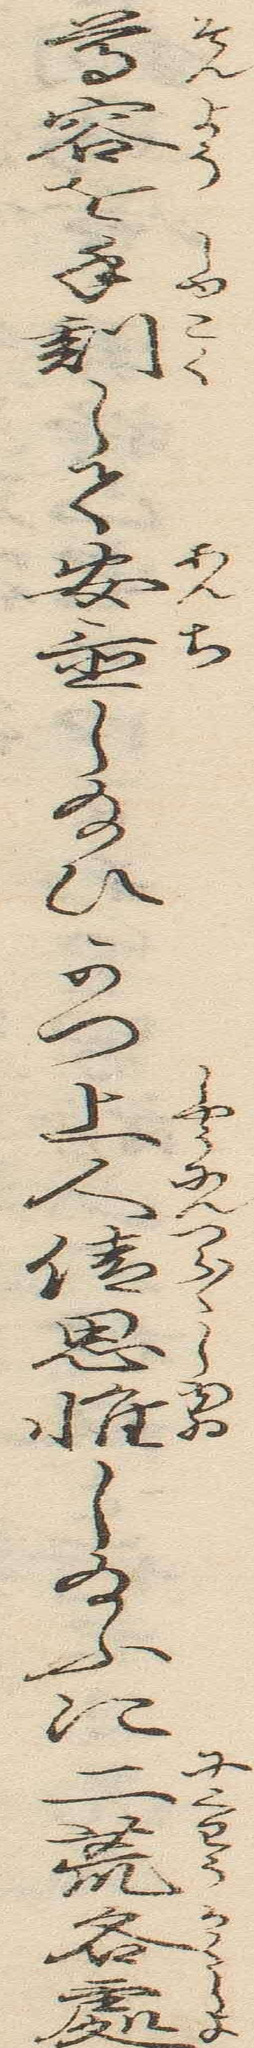尊容を手刻して安置し給ひかつ上人倩思惟し給ふに二荒各處
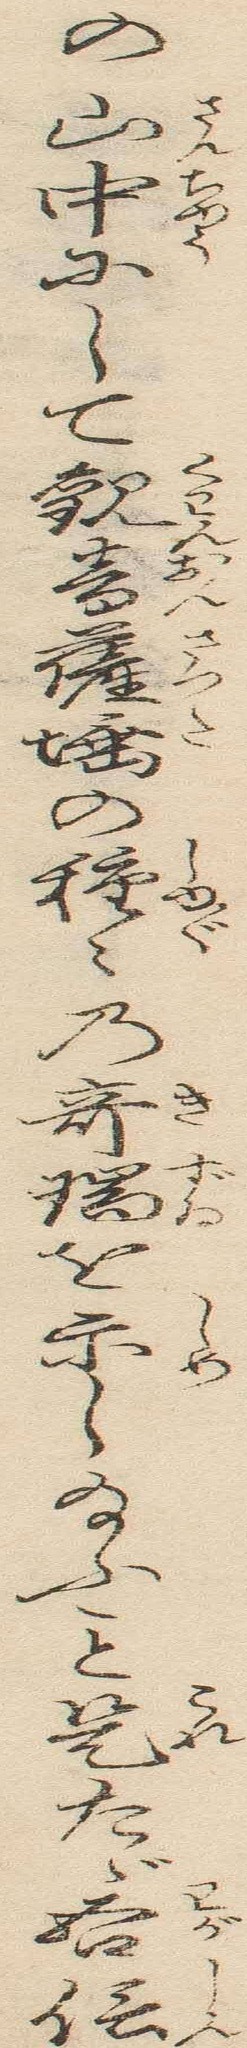の山中にして觀音薩埵の種〻の竒瑞を示し給ふこと是たゞ吾信
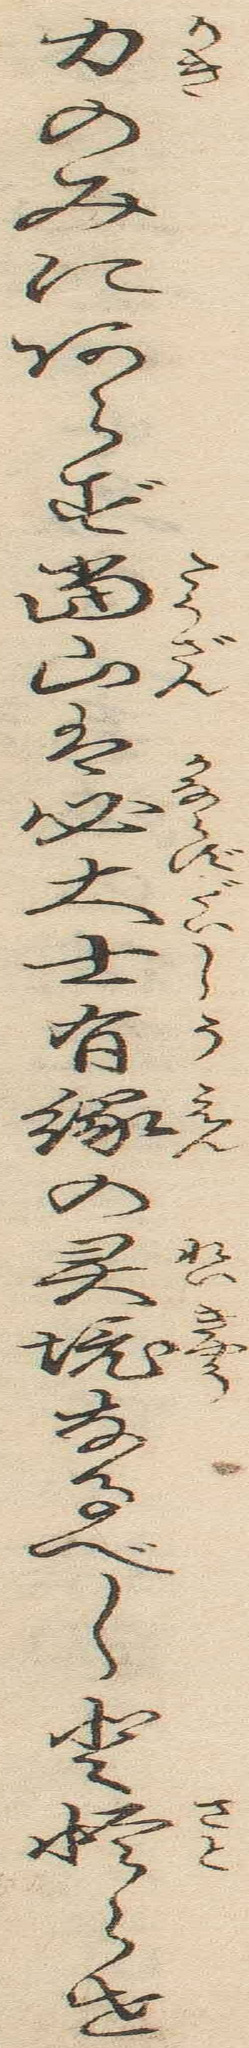力のみにあらず當山は必大士有縁の㚑境なるべしと悟らせ

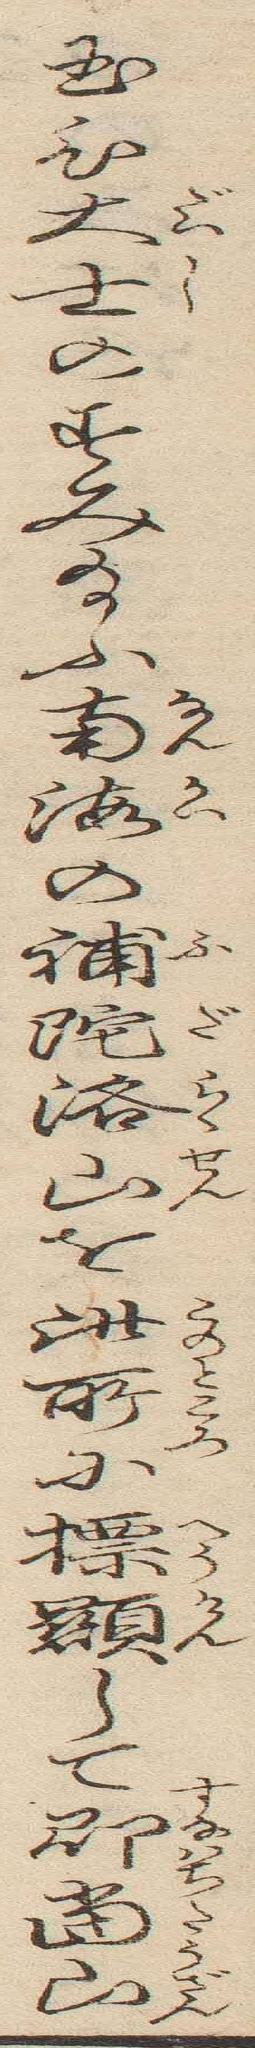玉ひ大士のすみ給ふ南海の補陀洛山を此所に標顯して即當山
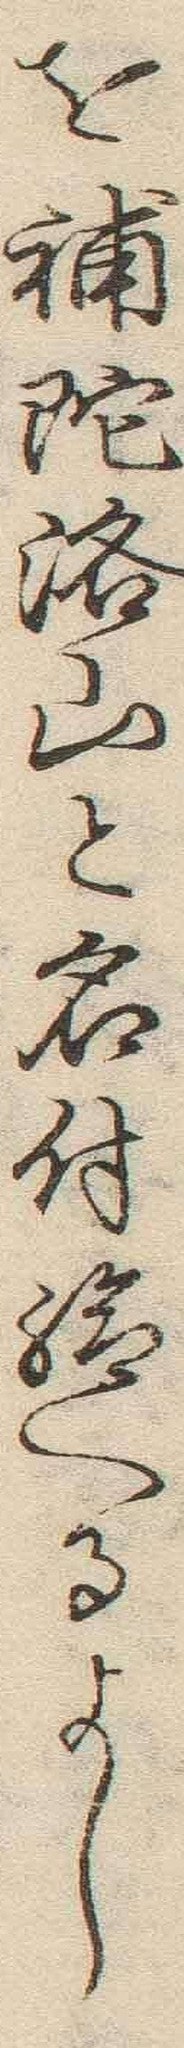を補陀洛山と名附給へるよし
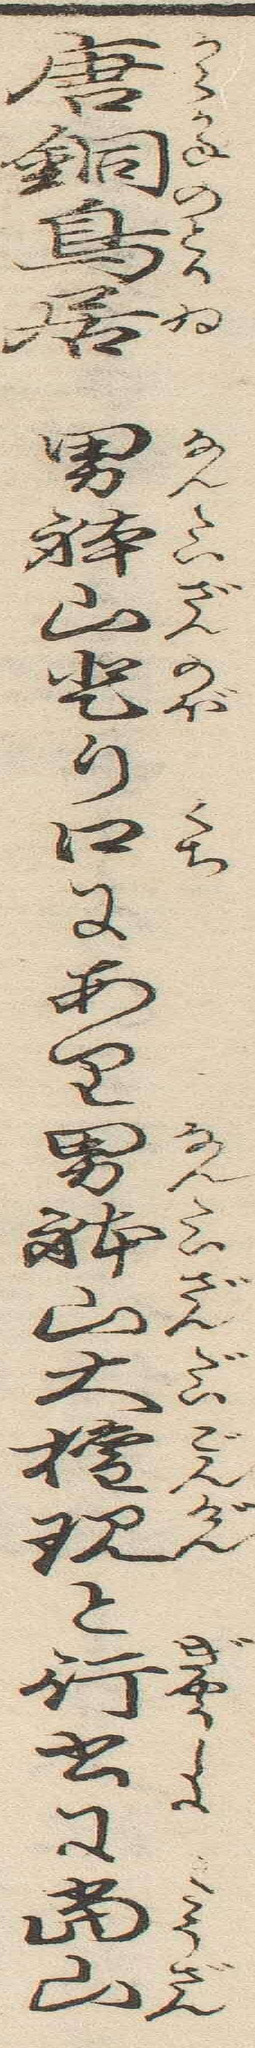唐銅鳥居男躰山登り口にあり男躰山大權現と行書に當山
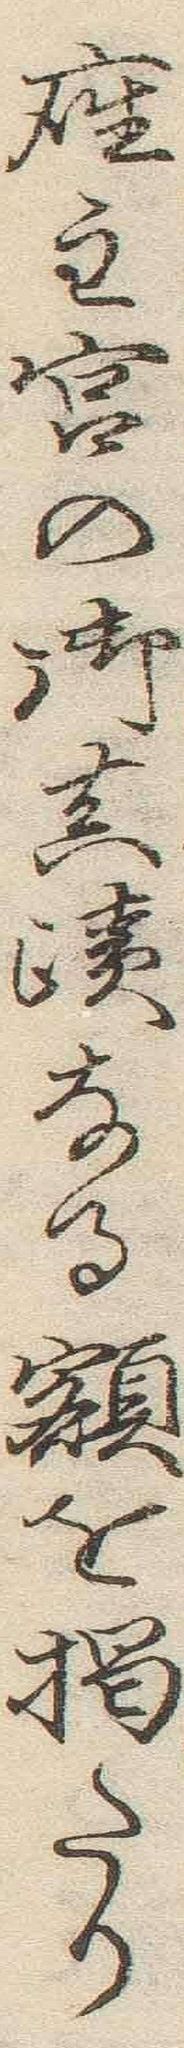座主宮の御真蹟なる額を掲たり
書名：日光山志
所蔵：東京学芸大学附属図書館 国文学研究資料館
